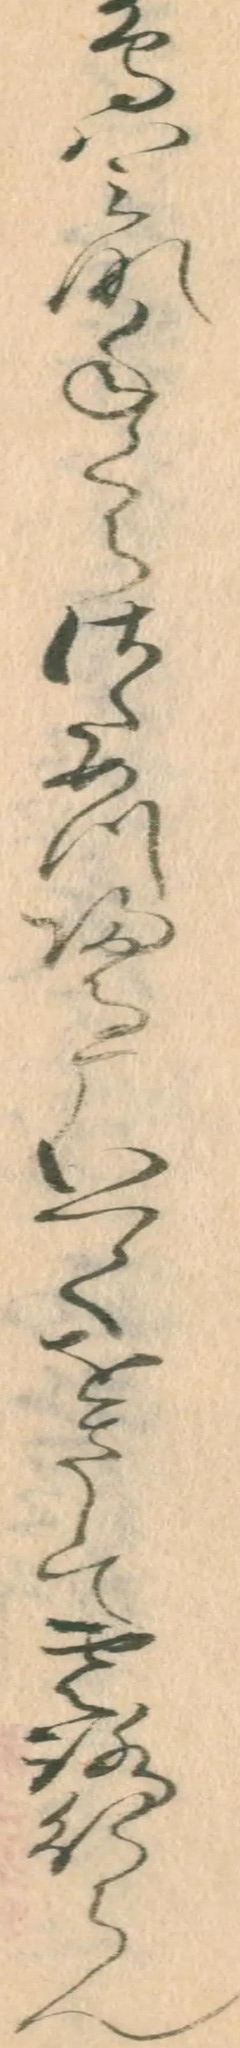鳥はみなねくらさためつ帰る雁いつくをさして雲路行らん
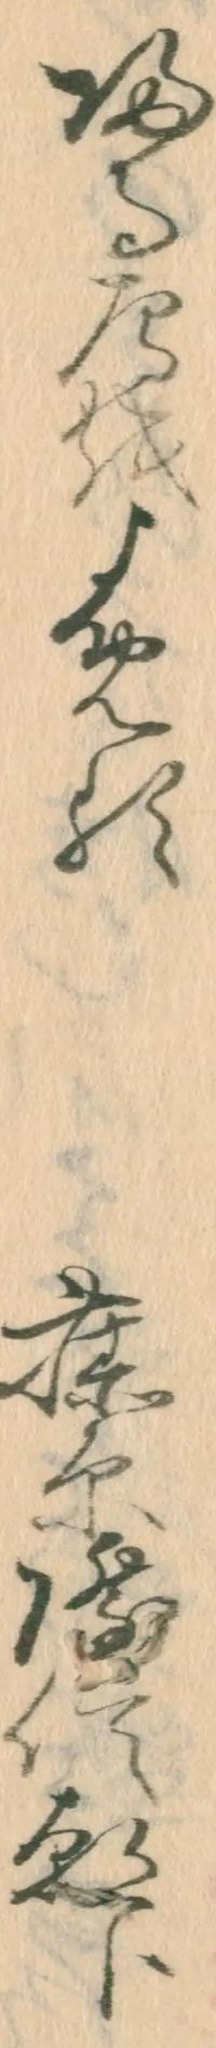帰る雁をよめる藤原隆信朝臣
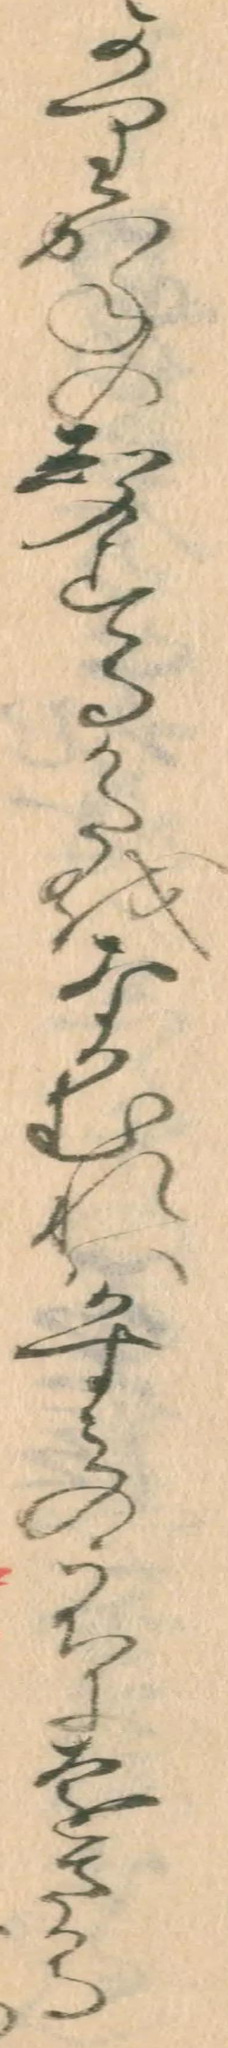かりかねの声するかたをなかむれはかすみのうちに遠さかるなり
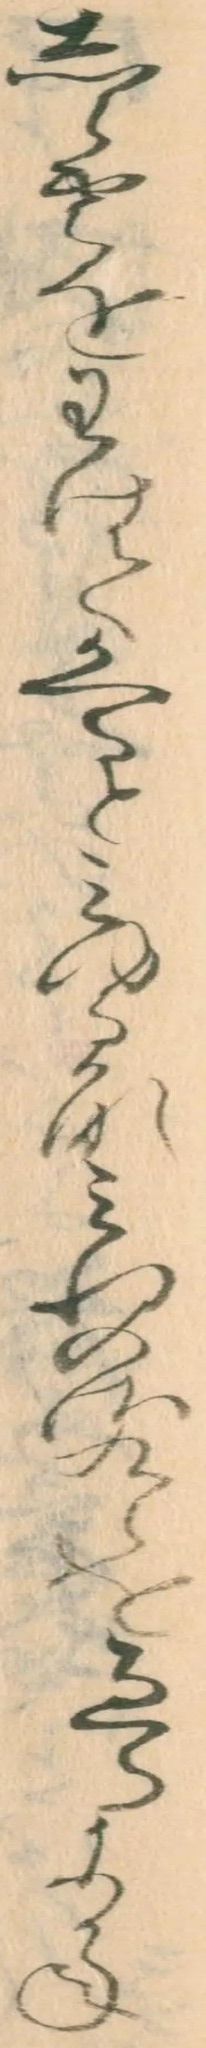しら雲をわけてかへるとみゆるかなみねのさくらを過るかりかね
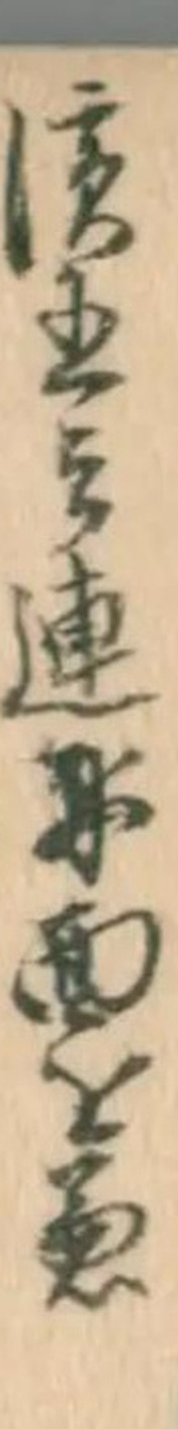浜臣云連に面を兼
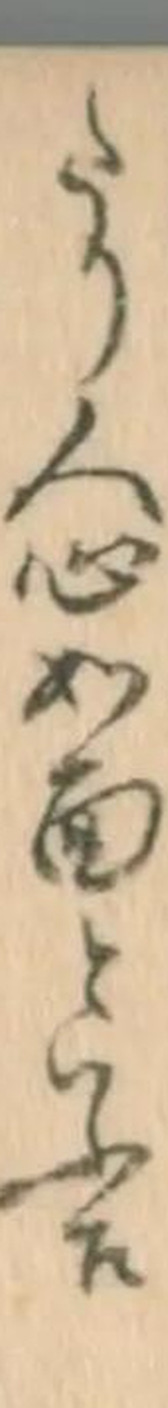たり人心如面といふ古
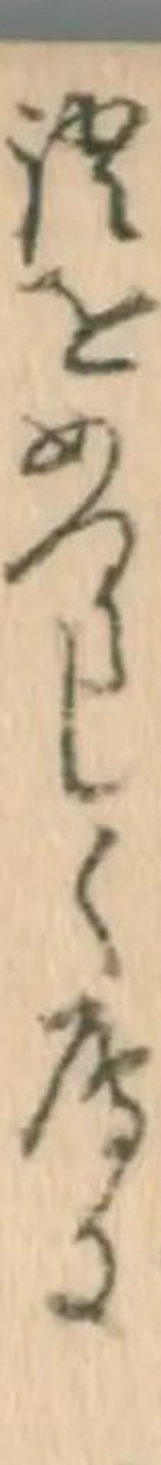語をめつらしく鳫に
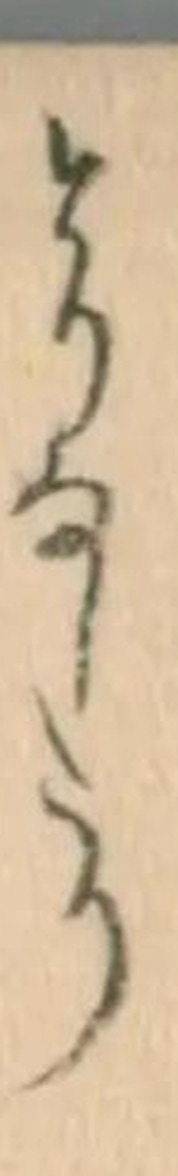とりなしたり
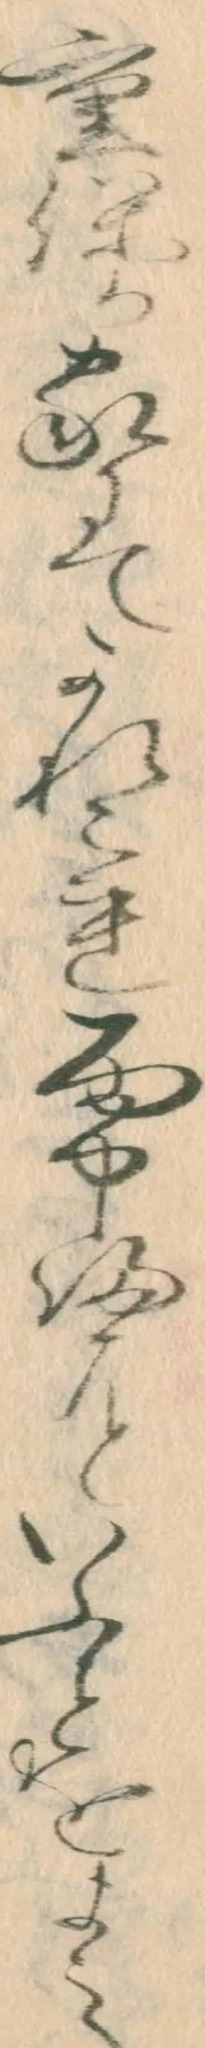重康か家にてかれこれ雨中帰雁といふことをよみ
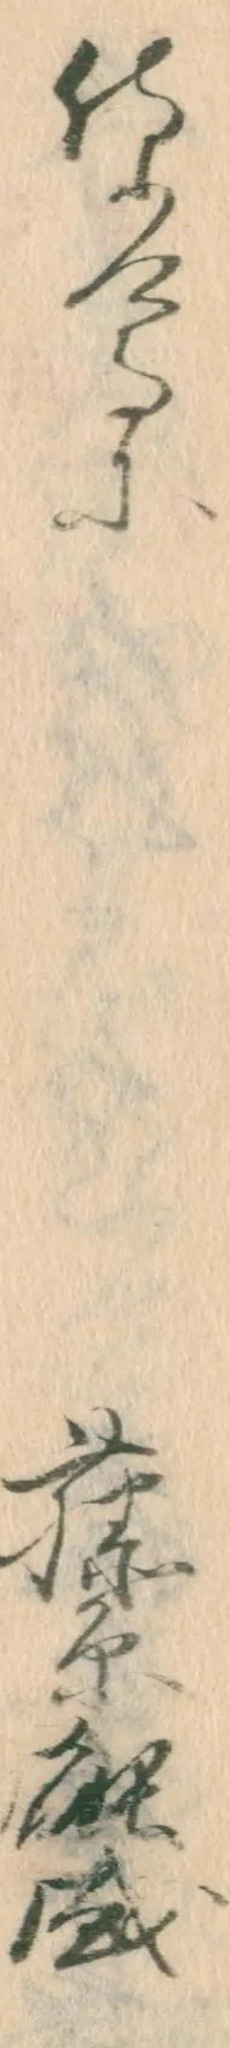侍りけるに藤原能成
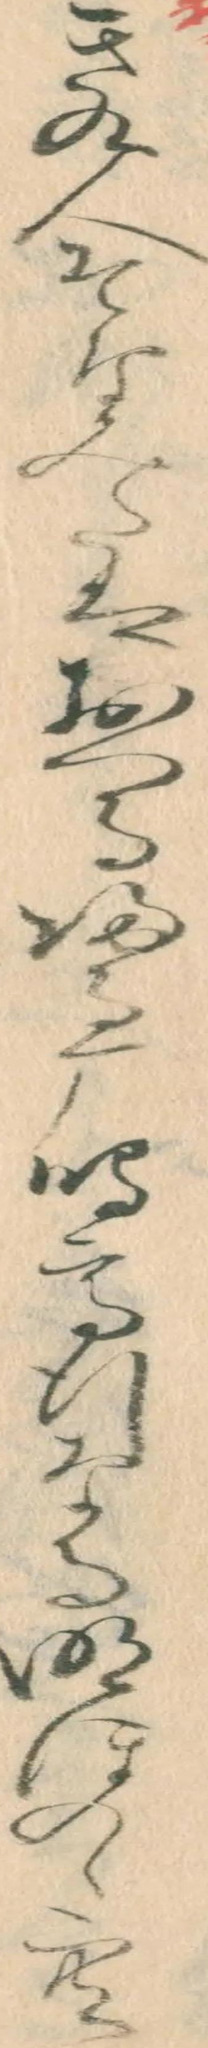きく人そなみたはおつる帰る雁鳴て行なる明ほのゝ空

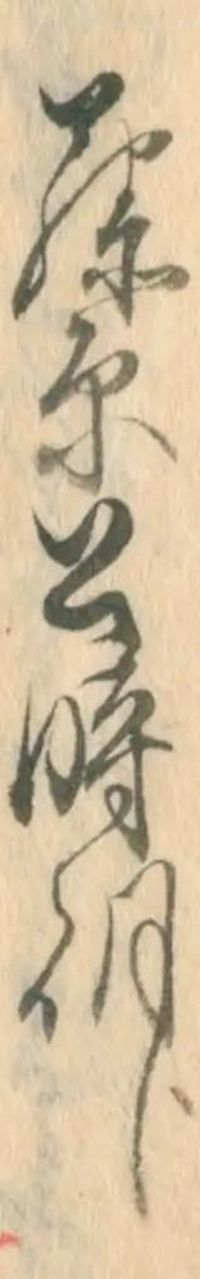藤原公時朝臣
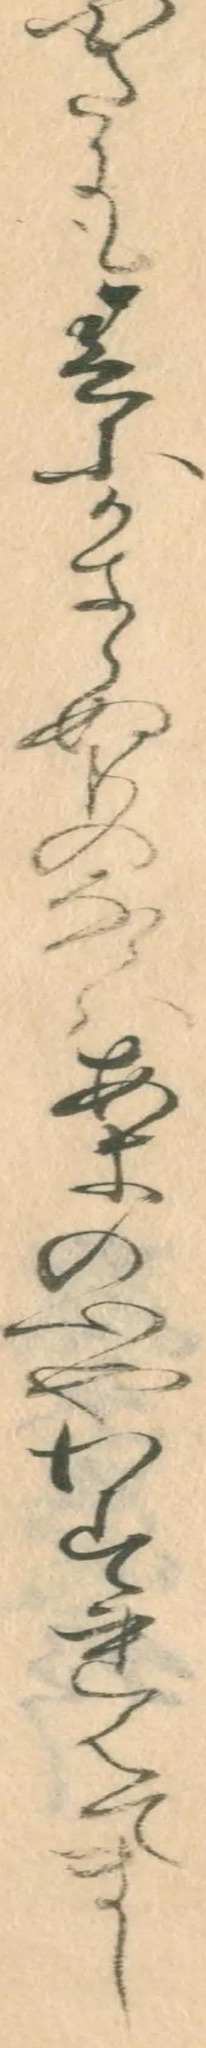花たにも春にかきらぬものならはあきの心やわすれはてまし
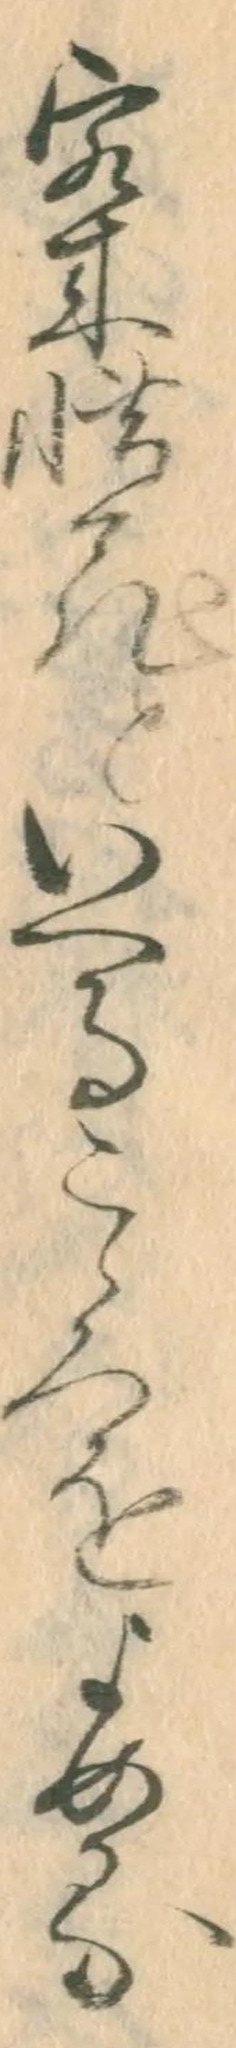客来惜花といへるこゝろをよめる
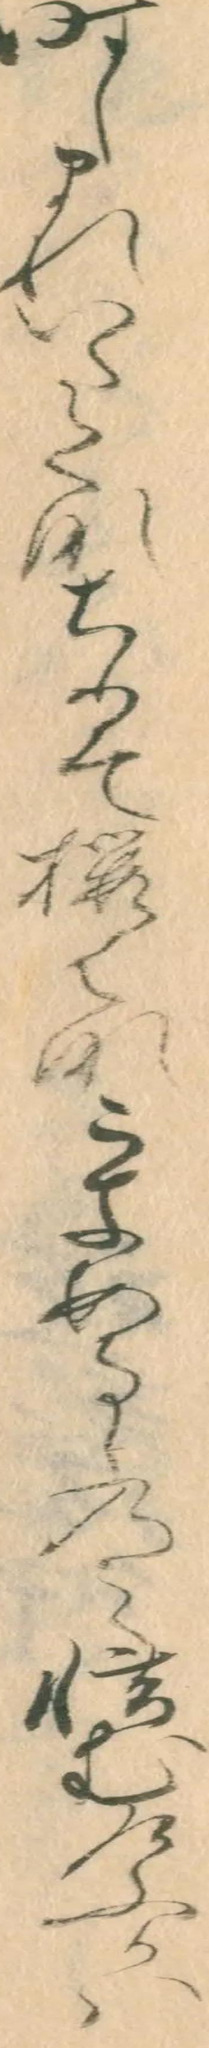時しまれいたくなちりそ桜はなうきあるしのみ惜むけふかは
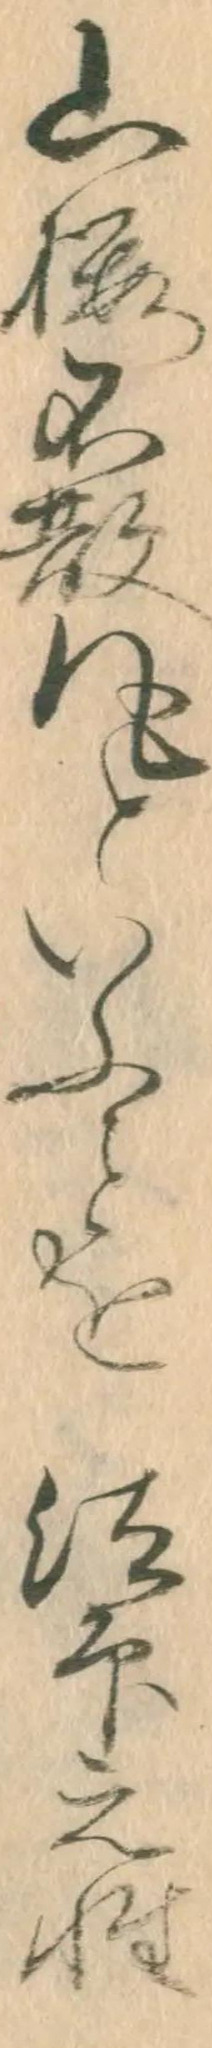山桜不散風といふことを法印元性
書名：月詣和歌集
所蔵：国立国会図書館 National Diet Library, JAPAN
